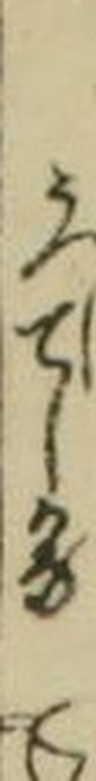うつしてしかな
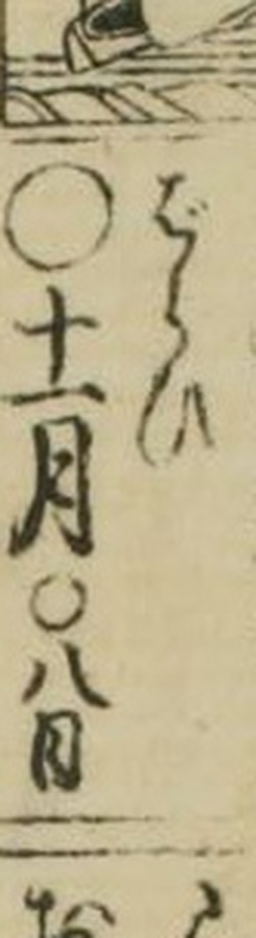○十一月○八日
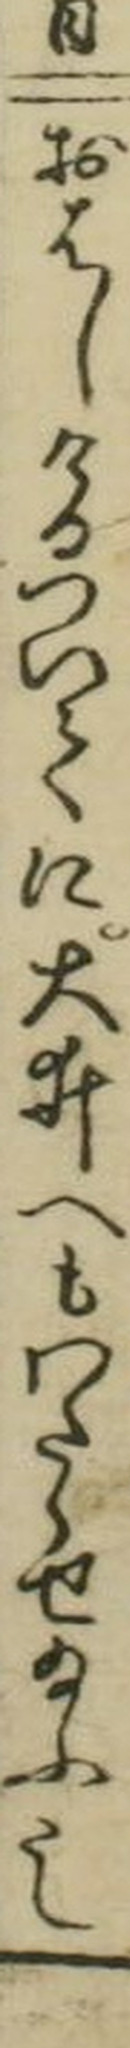おはしけるついてに。大井へもわたらせ給ふ也
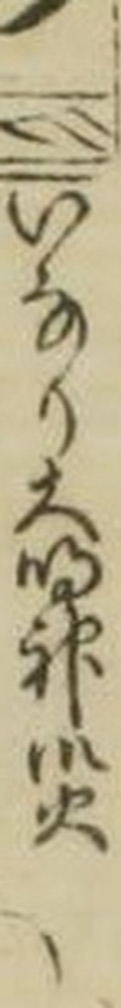いなり大明神御火
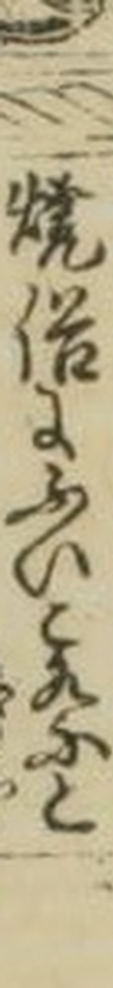焼俗にふいこ祭と
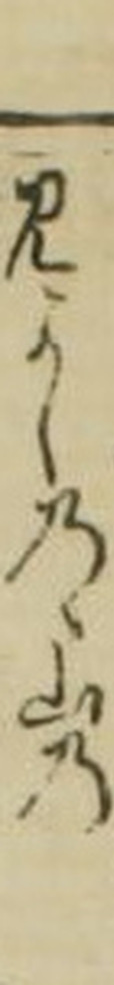みよしのゝ山の
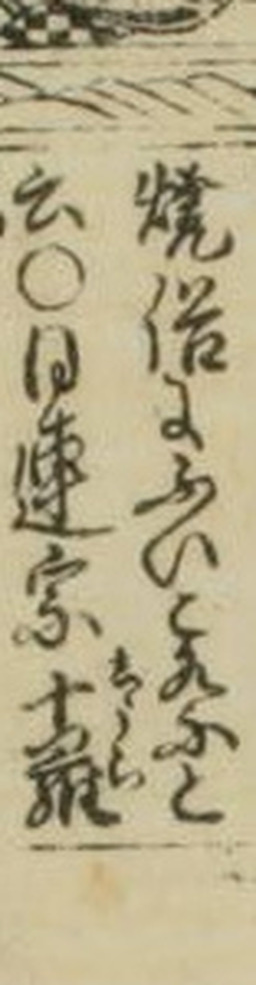云○日蓮宗十羅
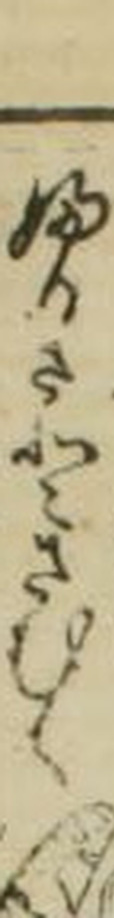ふるさとさむく
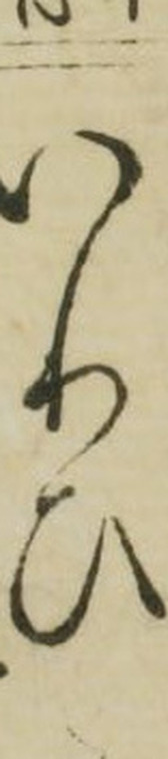いりひ
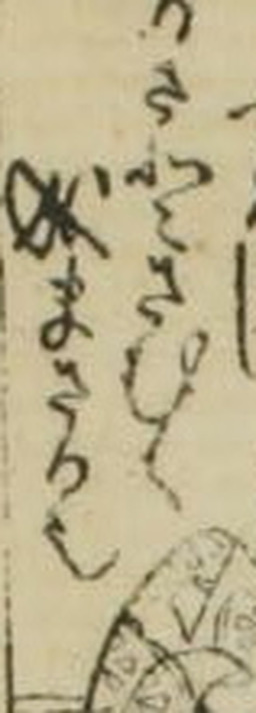成まさる也
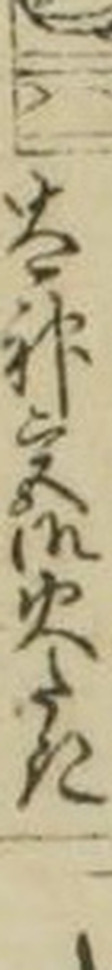太神宮御火たき
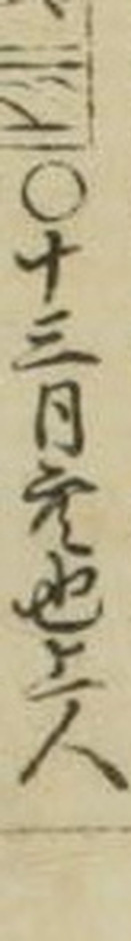○十三日空也上人
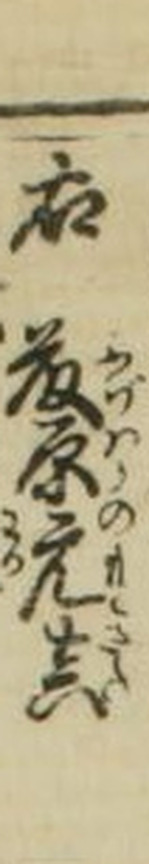右藤原元真
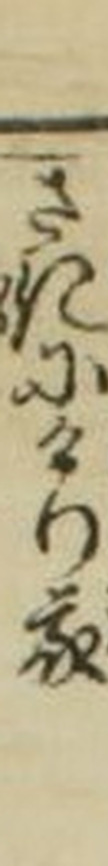さきにけり我
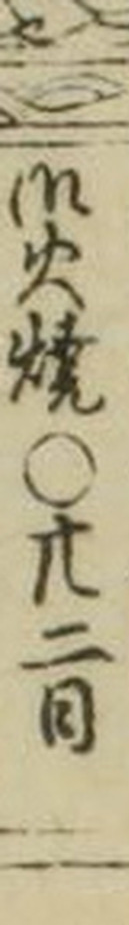御火焼○廿二日
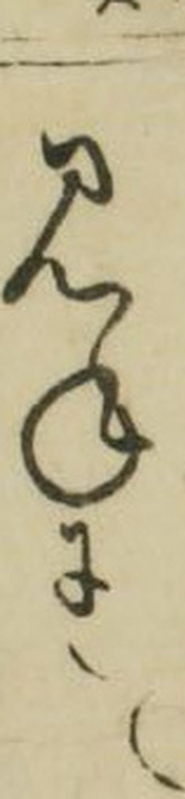みねに
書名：女源氏教訓鑑
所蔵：東京学芸大学附属図書館
